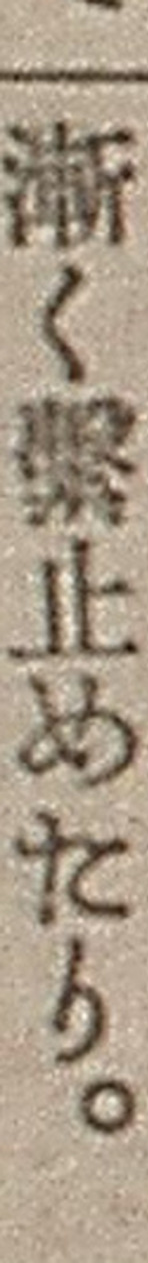漸く繋止めたり。
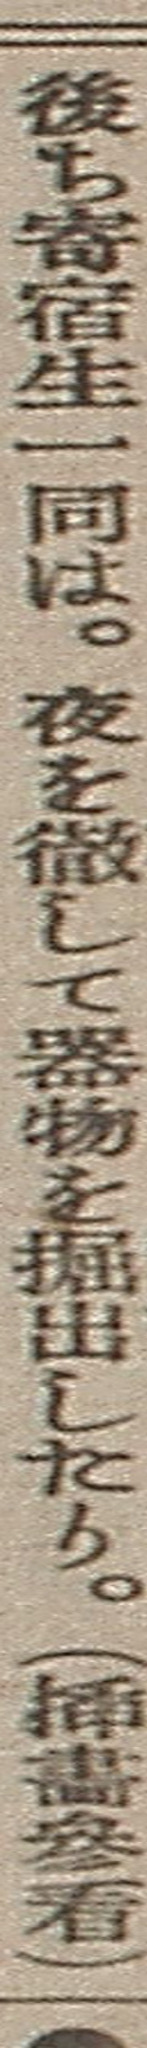後ち寄宿生一同は。夜を徹して器物を掘出したり。
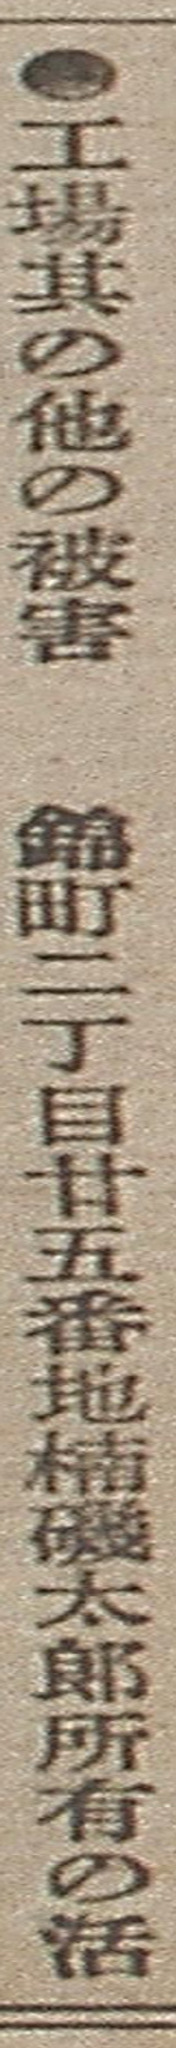●工場其の他の被害錦町二丁目廿五番地楠磯太郎所有の活
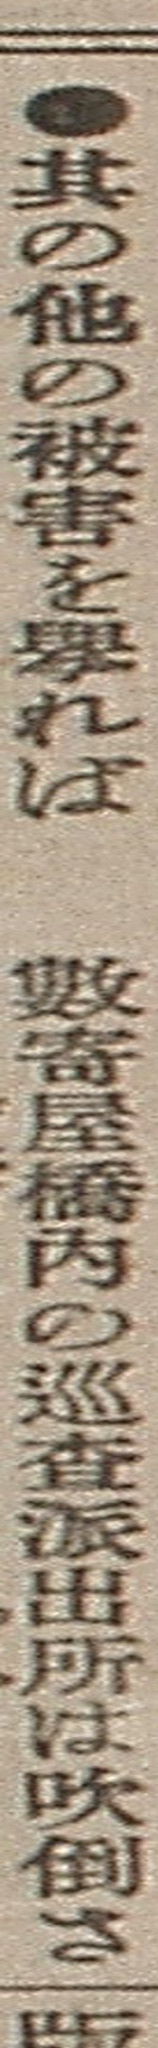●其の他の被害を挙れば数寄屋橋内の巡査派出所は吹倒さ
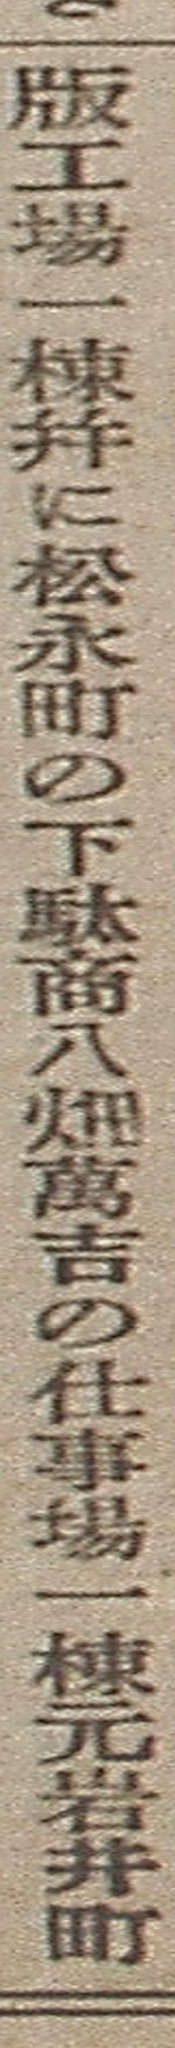版工場一棟幷に松永町の下駄商八畑萬吉の仕事場一棟元岩井町
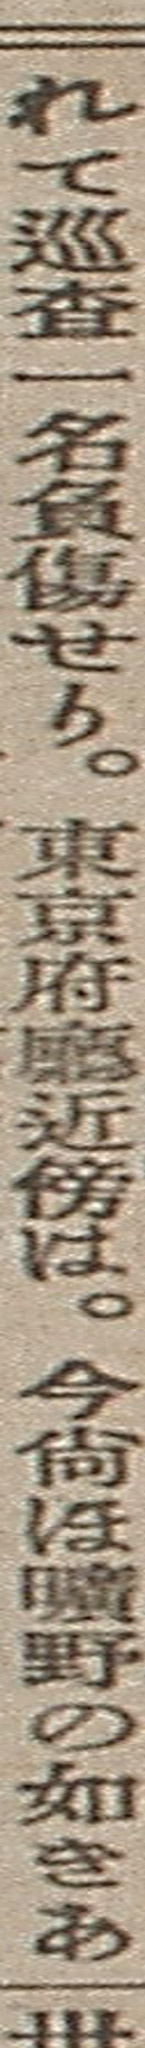れて巡査一名負傷せり。東京府庁近傍は。今尚ほ広野の如きあ
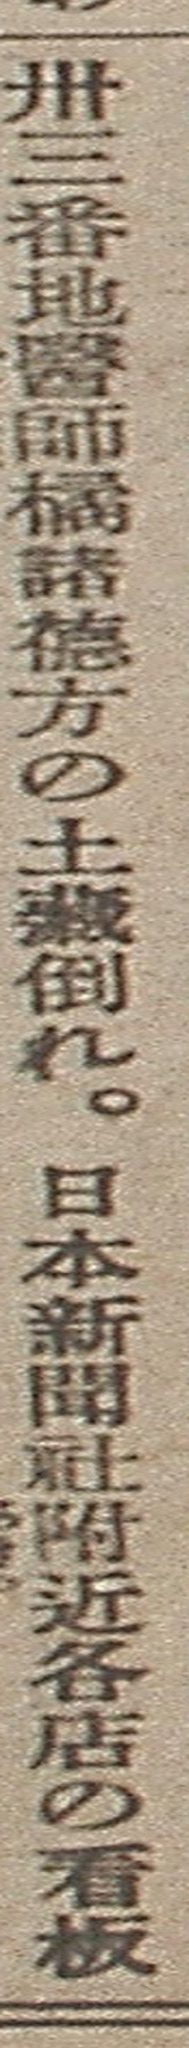卅三番地医師橘諸徳方の土蔵倒れ。日本新聞社附近各店の看板
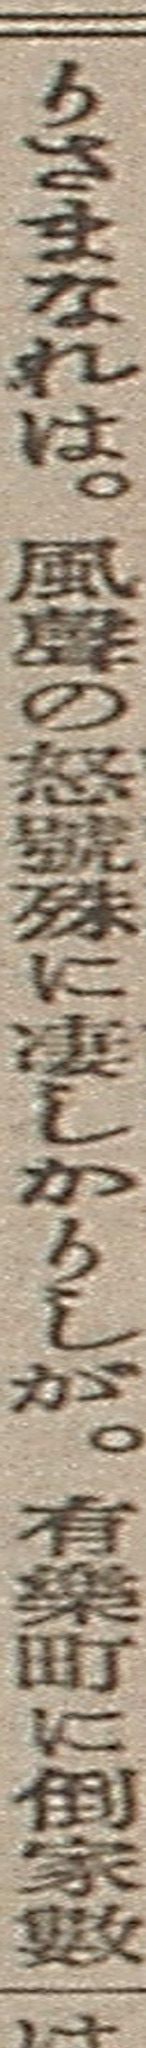りさまなれば。風声の怒号殊に凄しかりしが。有楽町に倒屋数
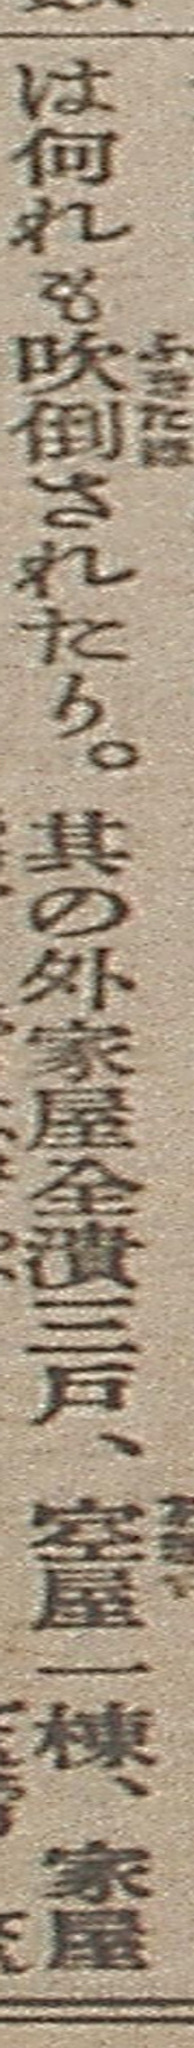は何れも吹倒されたり。其の外家屋全潰三戸、空屋一棟、家屋
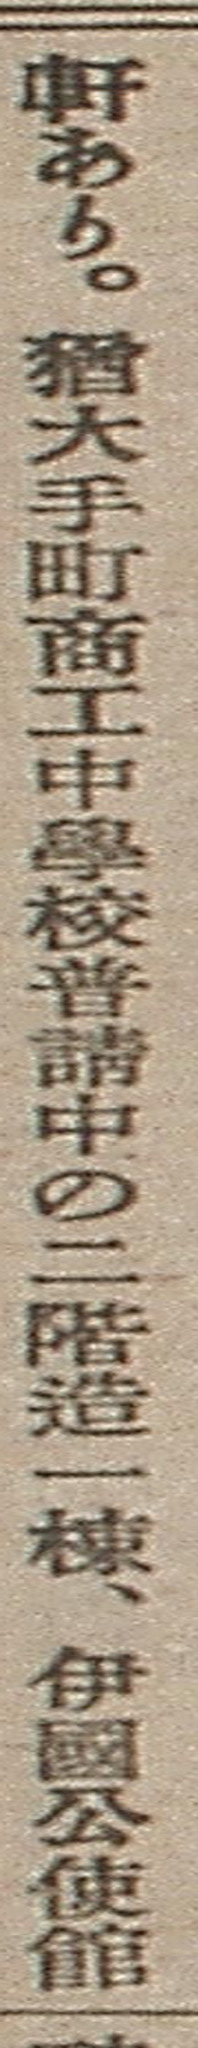軒あり。猶大手町商工中学校普請中の二階造一棟。伊国公使館
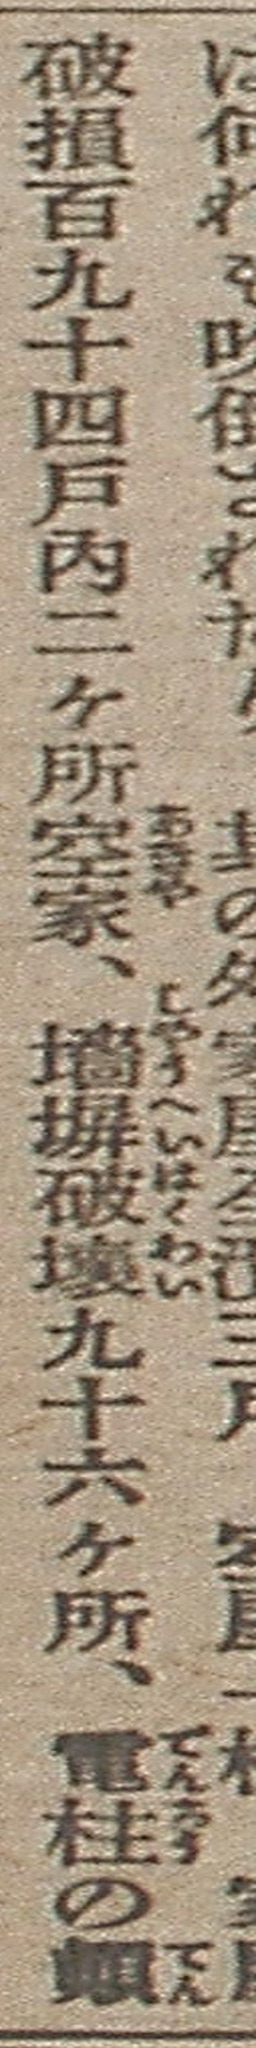破損百九十四戸内二ケ所空家、墻塀破壊九十六ケ所、電柱の顚

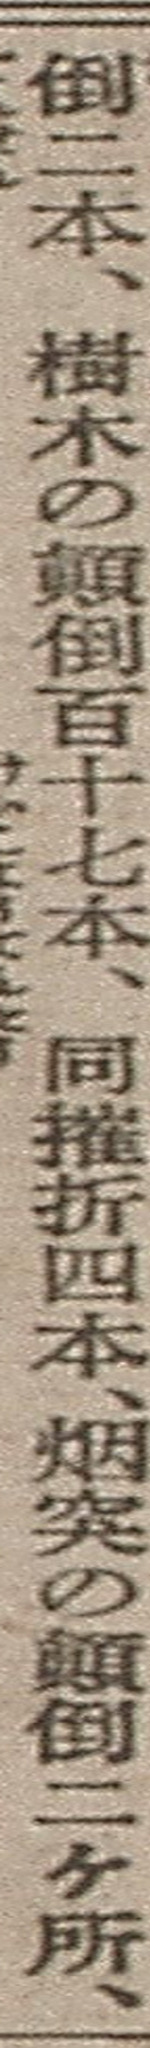倒二本、樹木の顛倒百十七本、同摧折四本、烟突の顛倒二ケ所、
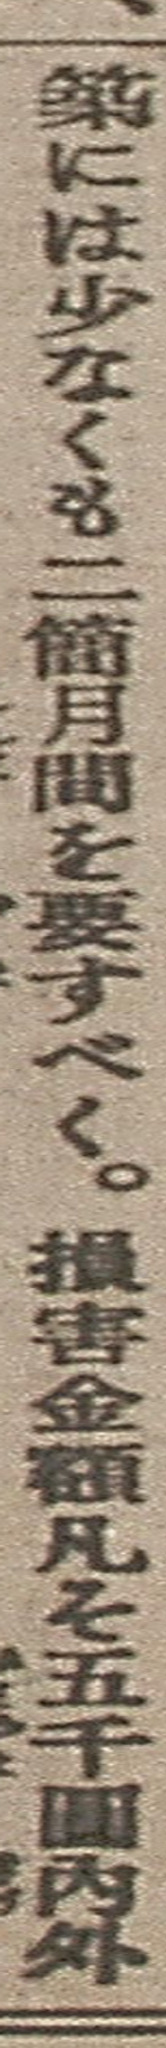築には少なくも二箇月間を要すべく。損害金額凡そ五千円内外
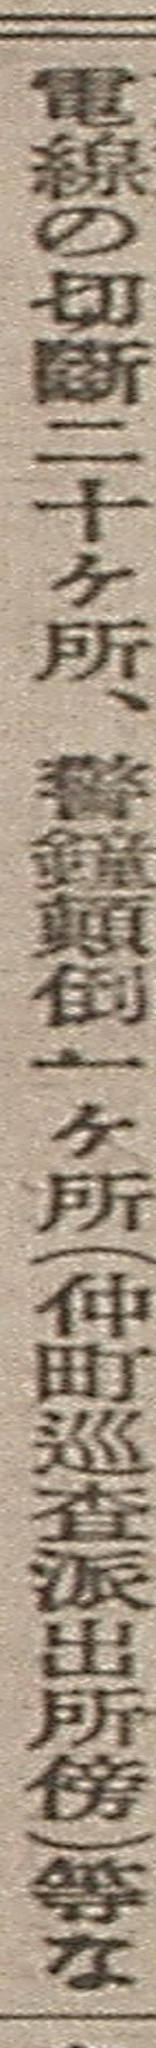電線の切断二十ケ所、警鐘顛倒一ケ所等な
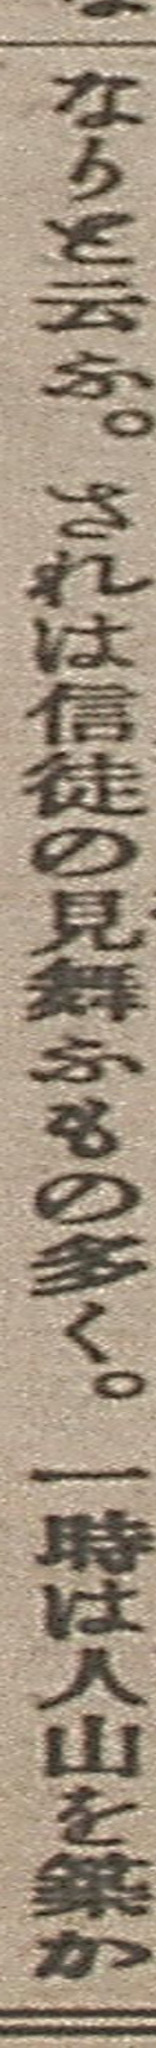なりと云ふ。されは信徒の見舞ふもの多く。一時は人山を築か
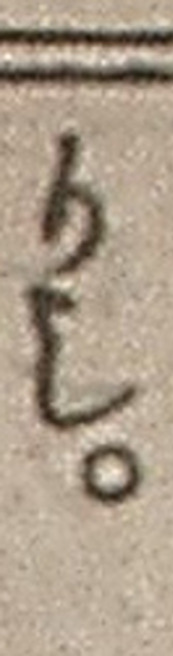りし。
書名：風俗畫報臨時増刊第百九十九號　明治三十二年十月各地災害圖會（前編之續）
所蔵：東京大学地震研究所図書室 Earthquake Research Institute Library, The University of Tokyo, JAPAN
